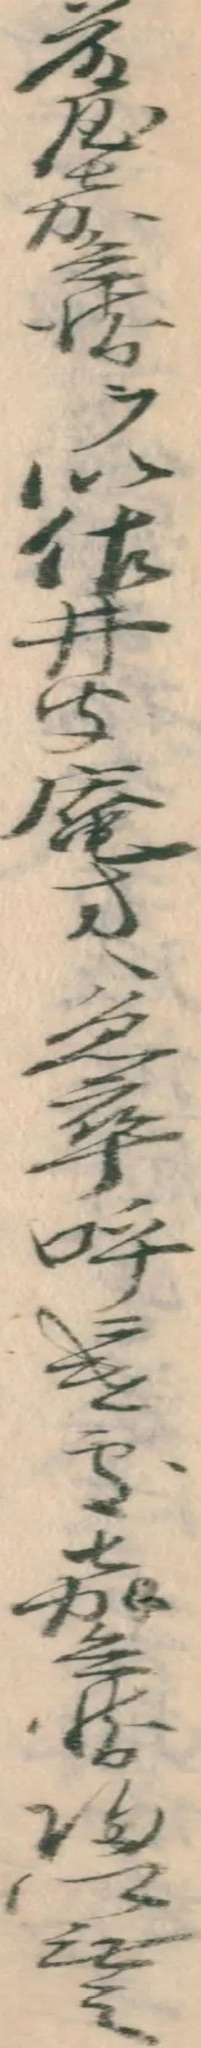藤屋嘉兵衛ヲ以佐井聞庵方へ急卒呼ニ遣處嘉兵衞帰郷無之
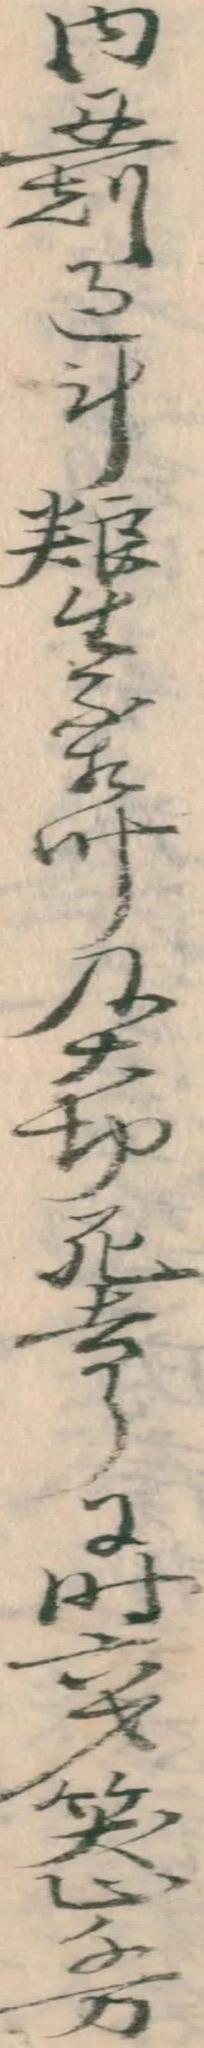内丑刻過斗養生不相叶及大切死去了于時六才笑止千万
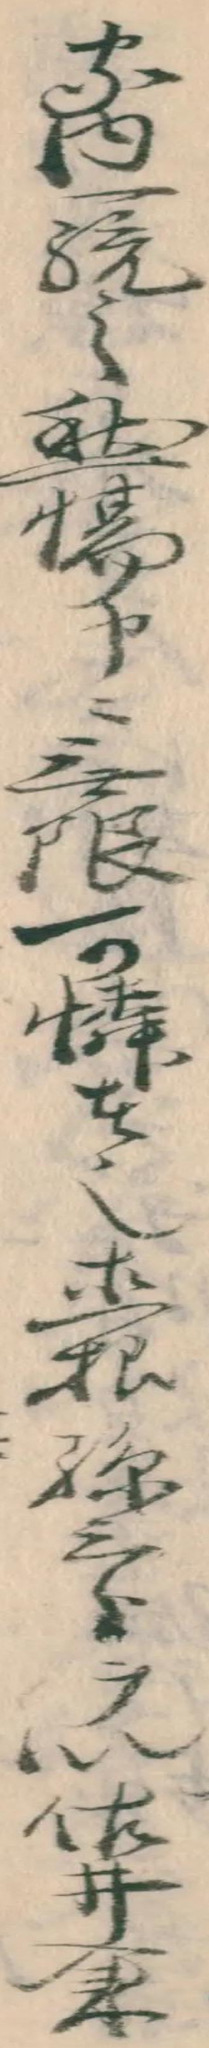家内一統之愁傷申ニ無限可憐者也直様孫三郎ヲ以佐井入来
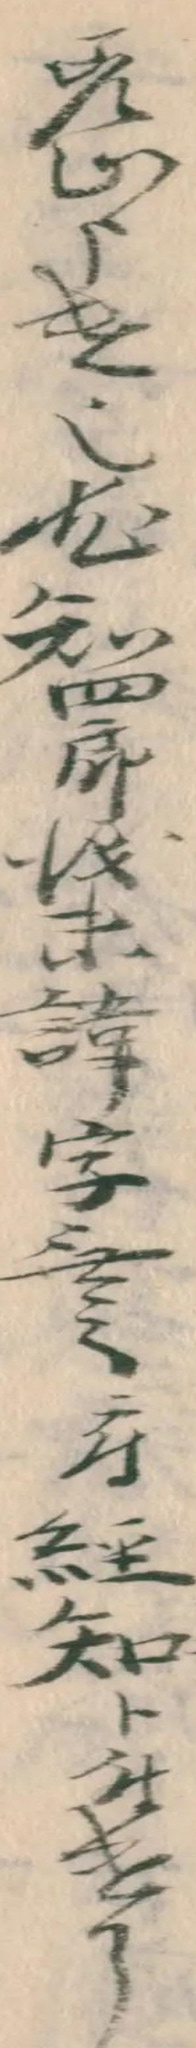差止申遣也尤知四郎儀未諱字無之ニ付経知ト付遣了
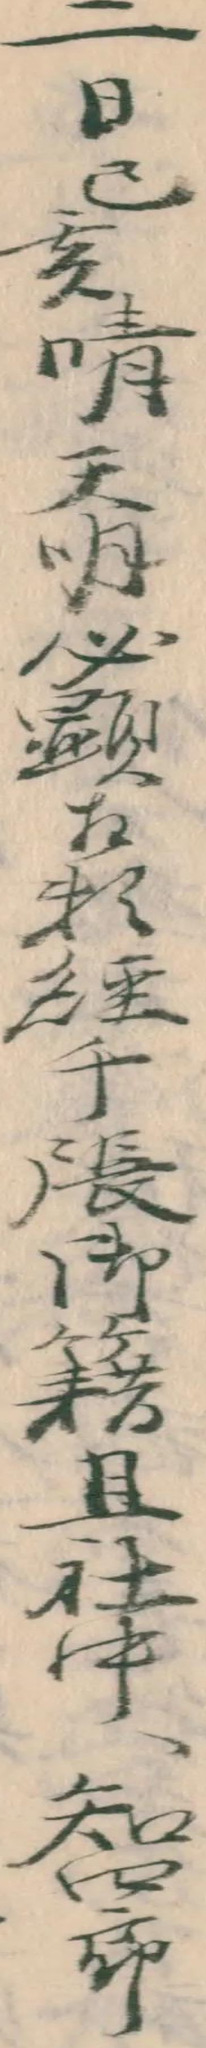二日己亥晴天明必顕相頼経千張御籍且社中へ知四郎
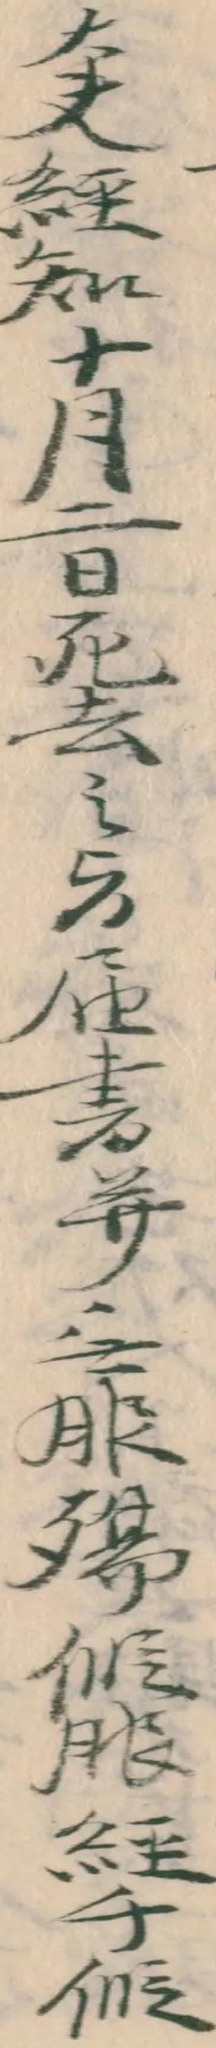大夫経知十月二日死去之旨届書幷無服殯假服経千假
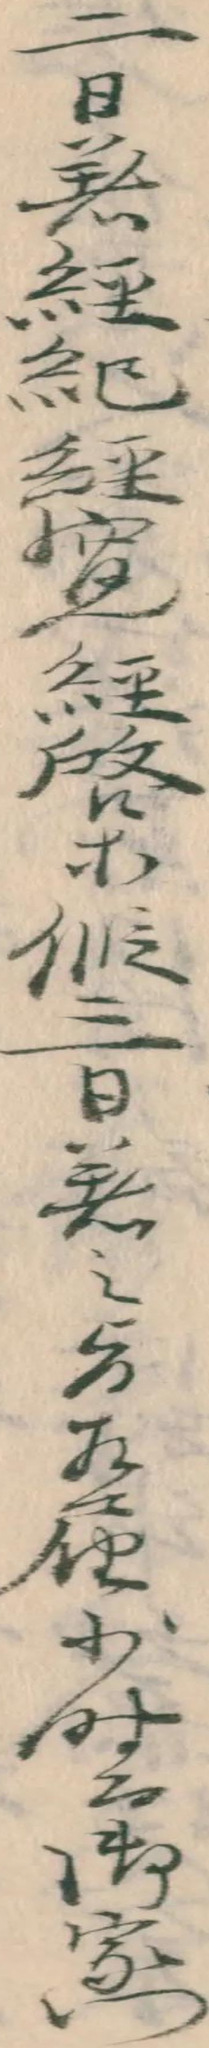二日着経紀経寛経啓等假三日着之旨相届少時而御家門
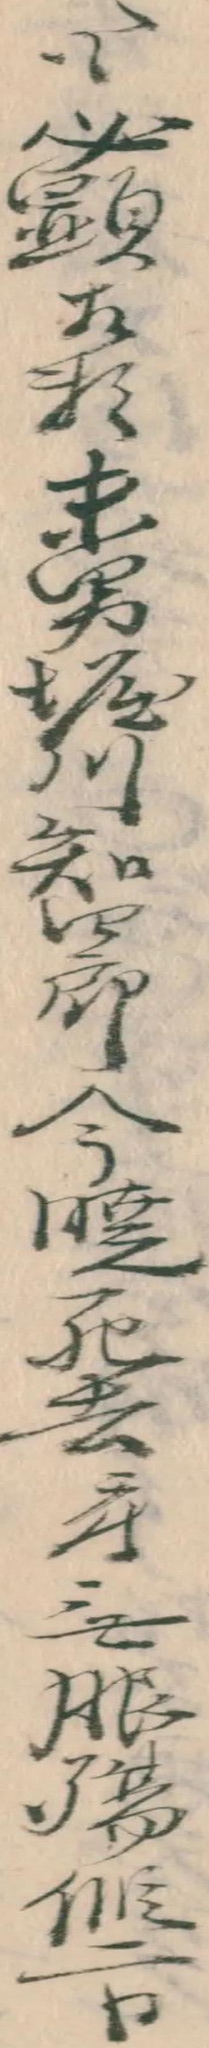へも必顕相類末男堀川知四郎今暁死去ニ付無服殯假二日
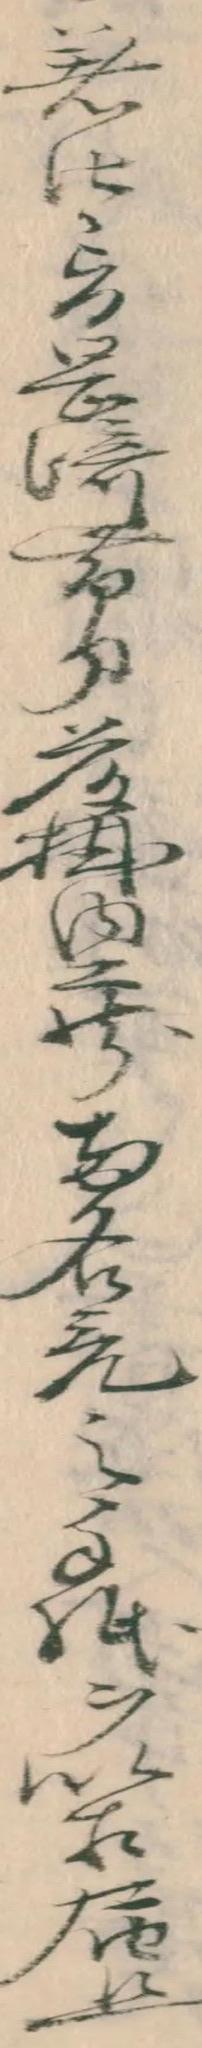着由ニ旨岡崎帯刀藤掛内蔵両名充之手紙ヲ以相届且
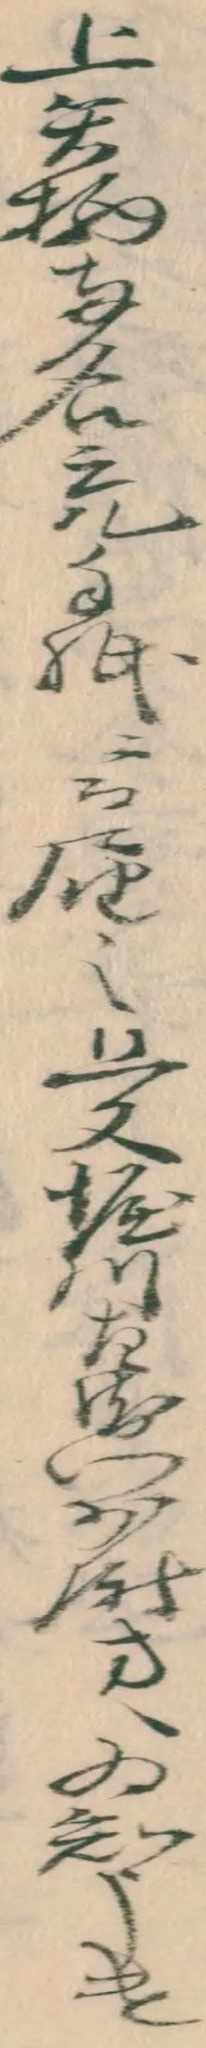上矢柄両名充手紙ニ而届也且又堀川左衛門少尉方へ為知申遣
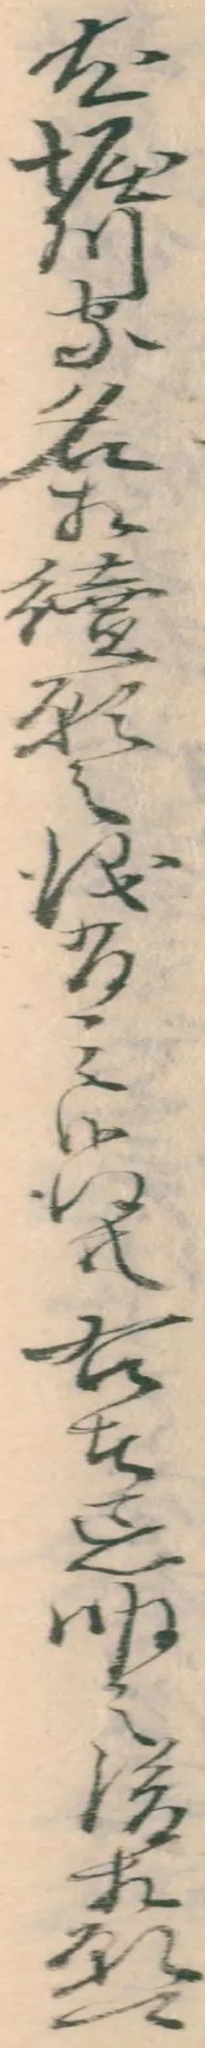尤堀川家名相續願之儀有之候得共右は忌明之後相願可
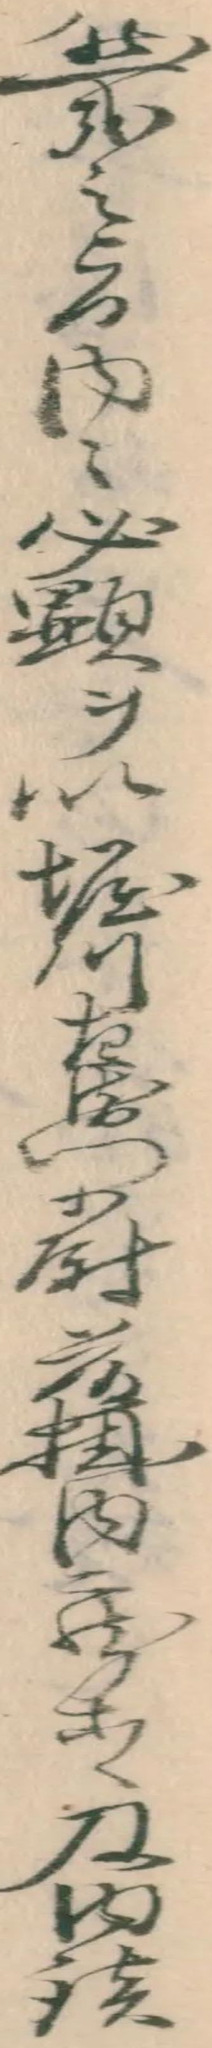然哉之旨内々必顕ヲ以堀川左衛門少尉藤掛内蔵等へ及内談
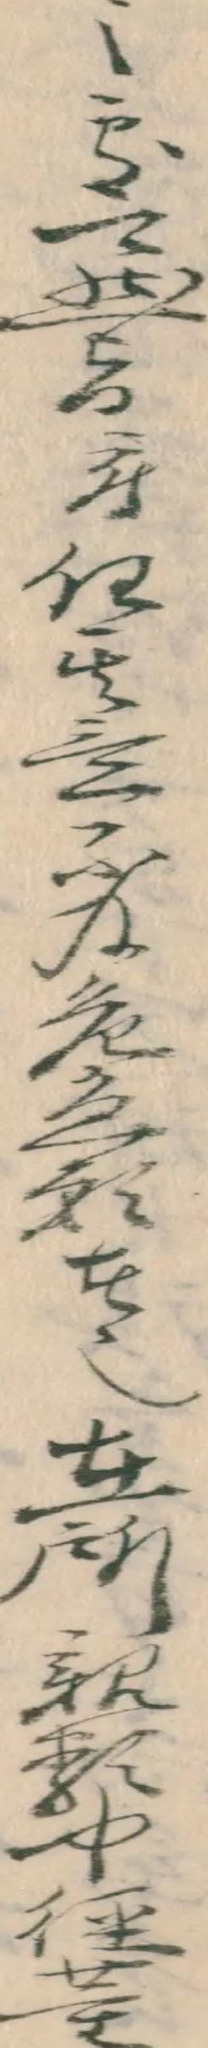之處可然旨ニ付任其意不及危急願者也在所親類中経董
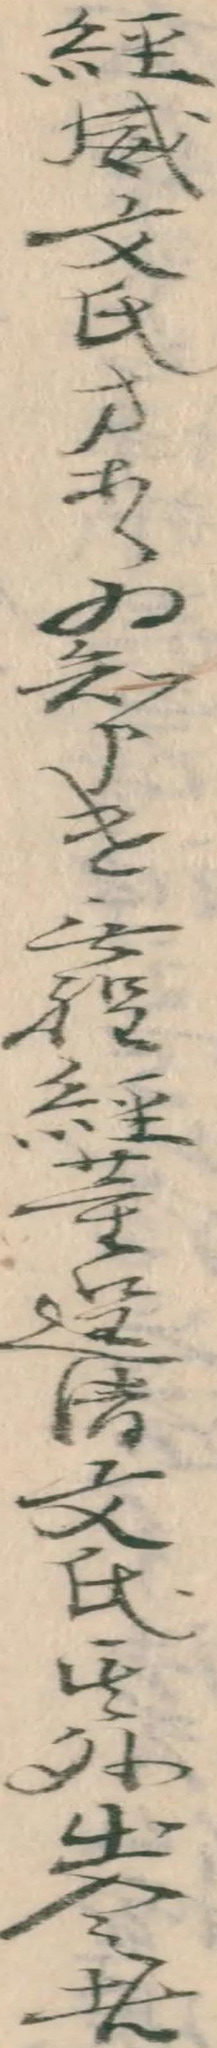経威文氏方等へ為知申遣無程経董逞清文氏其外出入之者
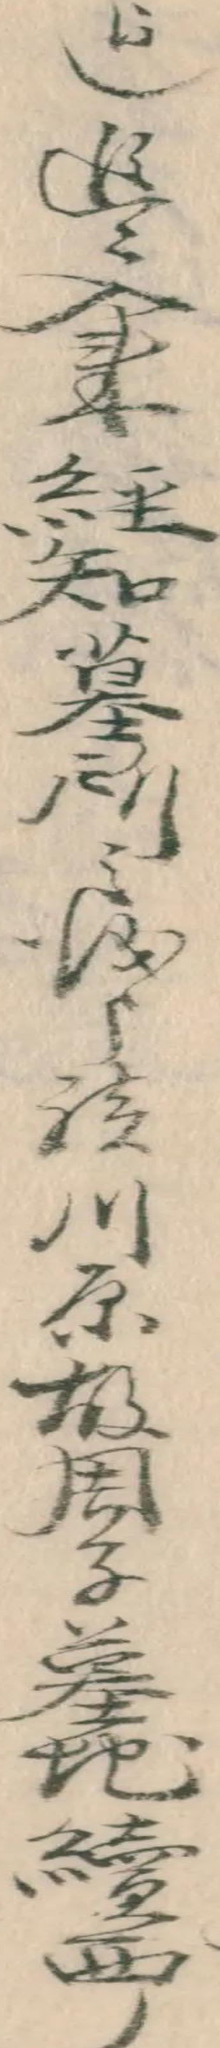迄追々入来経知墓所之儀申談候原故周子墓地續西ノ
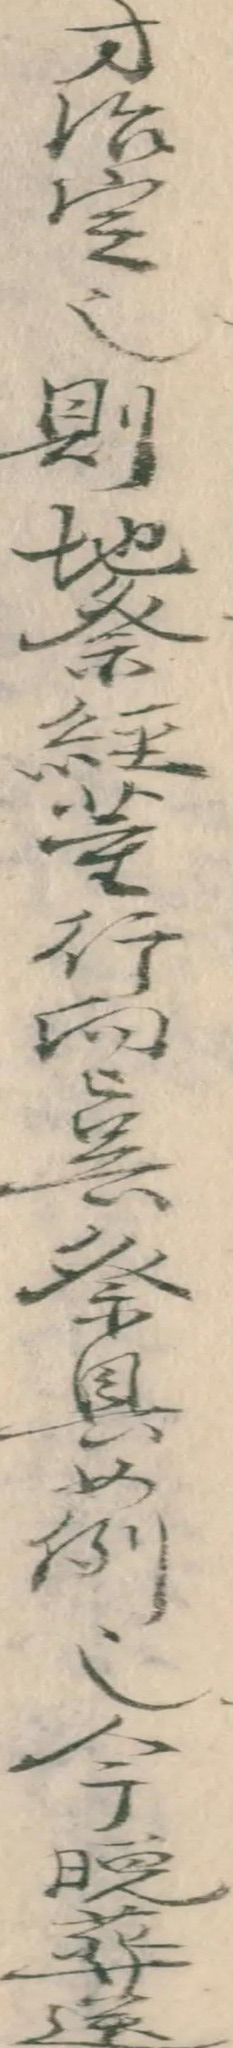方治定也則地祭経董行向被祭具如例也今晩葬送
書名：賀茂社記録. 第66冊
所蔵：国立国会図書館 National Diet Library, JAPAN
